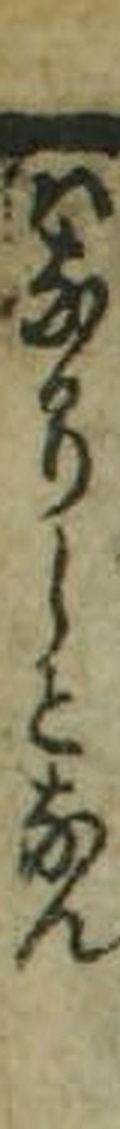はなかりしとなん

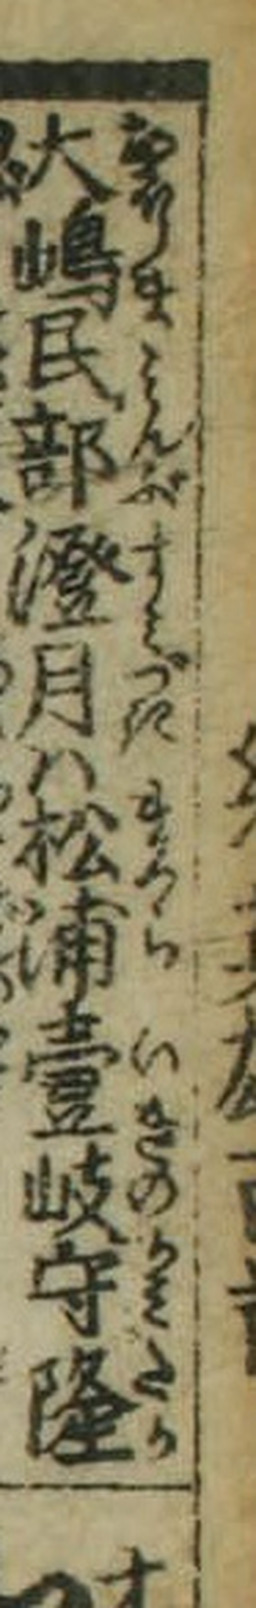大嶋民部澄月は松浦壱岐守隆
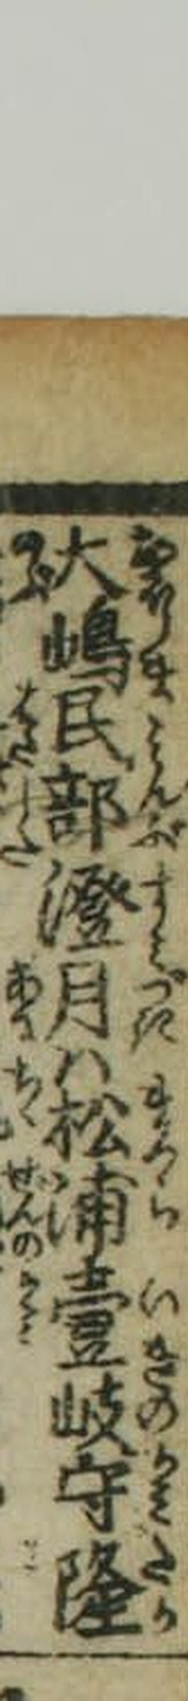大嶋民部澄月は松浦壱岐守隆
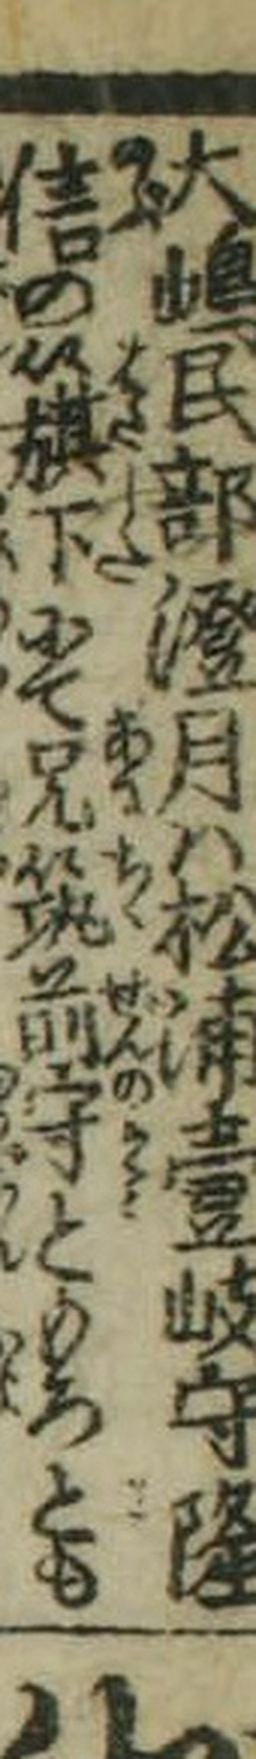信の籏下にて兄筑前守ともろとも
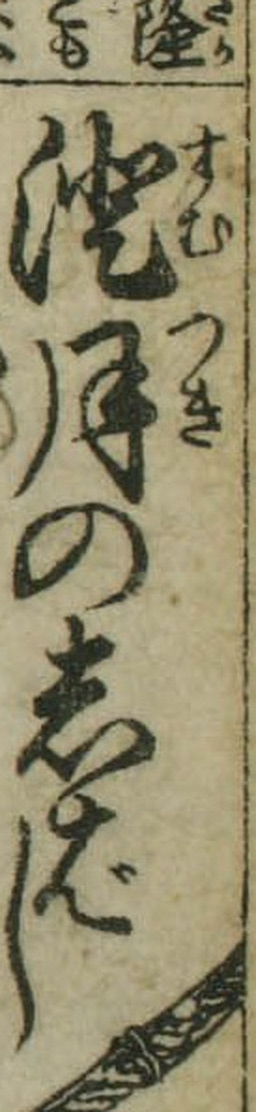澄月のしばし
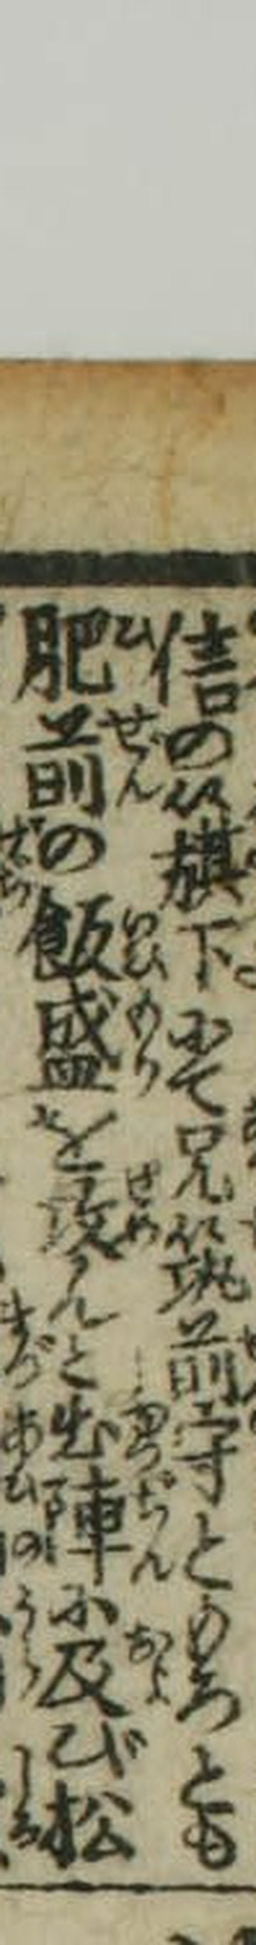肥前の飯森を攻んと出陣に及び松
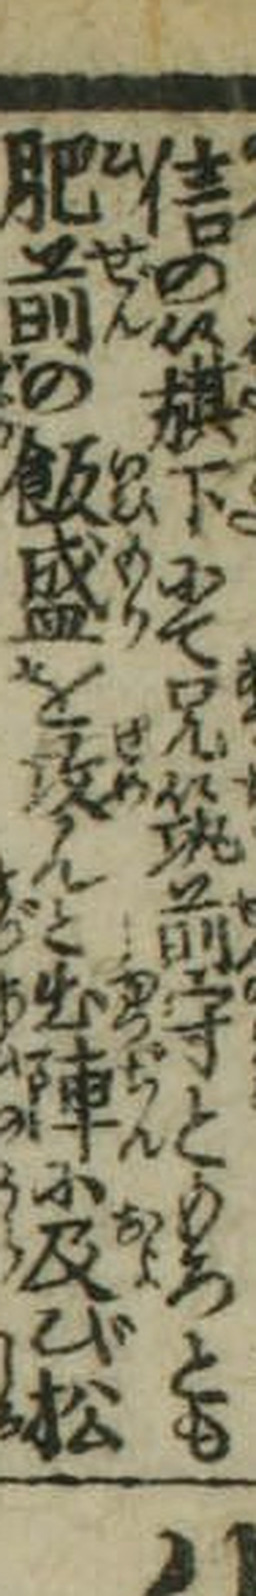肥前の飯森を攻んと出陣に及び松
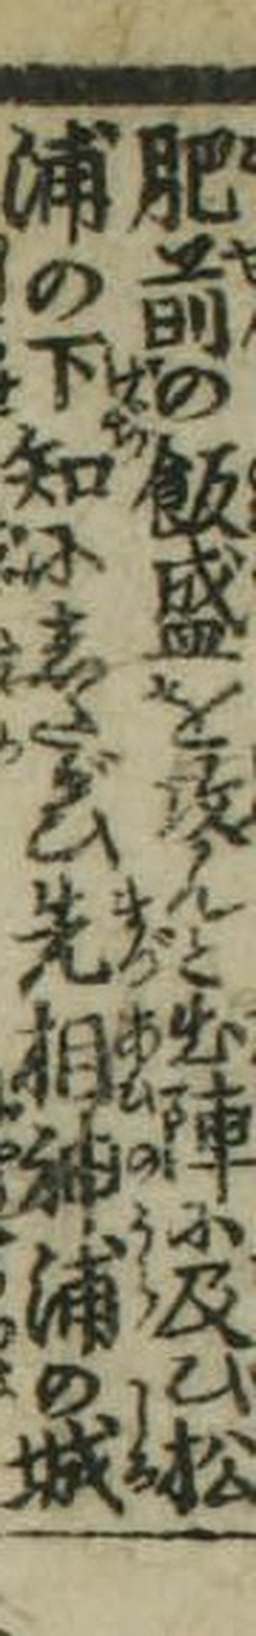浦の下知にしたがひ先相神浦の城
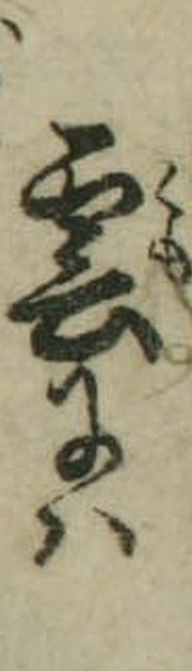雲には
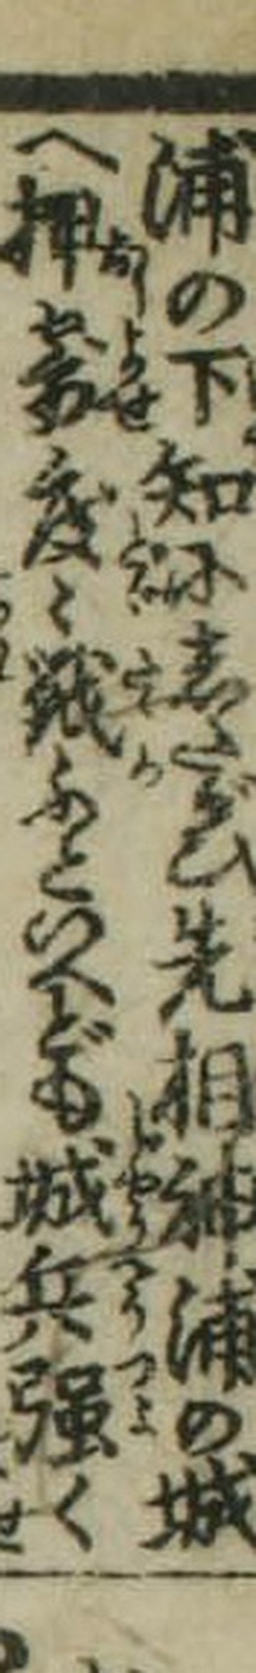へ押寄度々戦ふといへども城兵強く
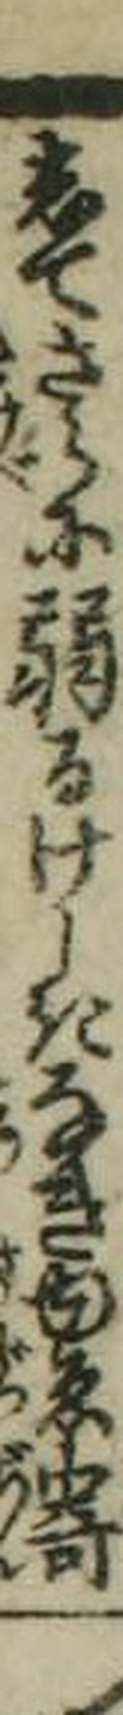してさらに弱るけしきなきゆゑ寄
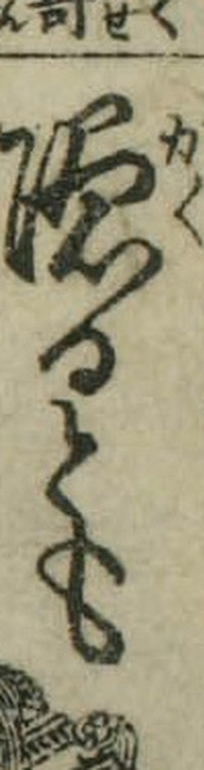隠るとも
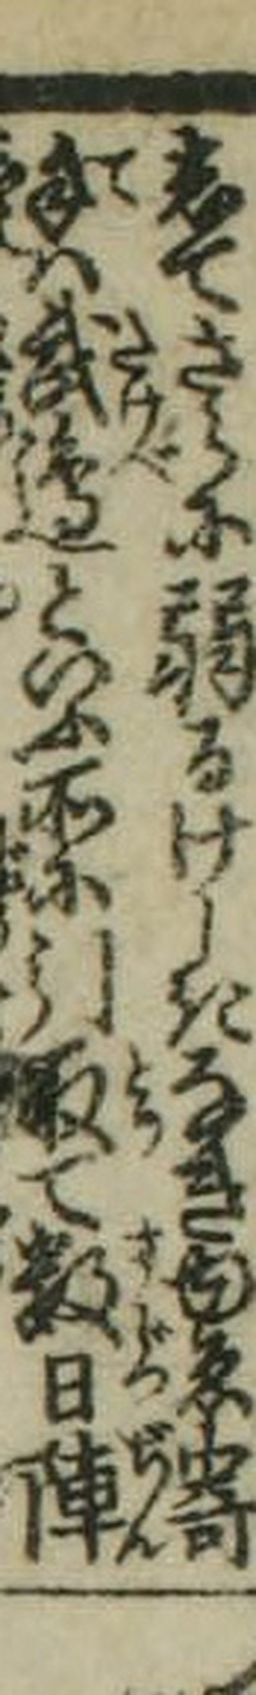手は武辺といふ所に引取て数日陣
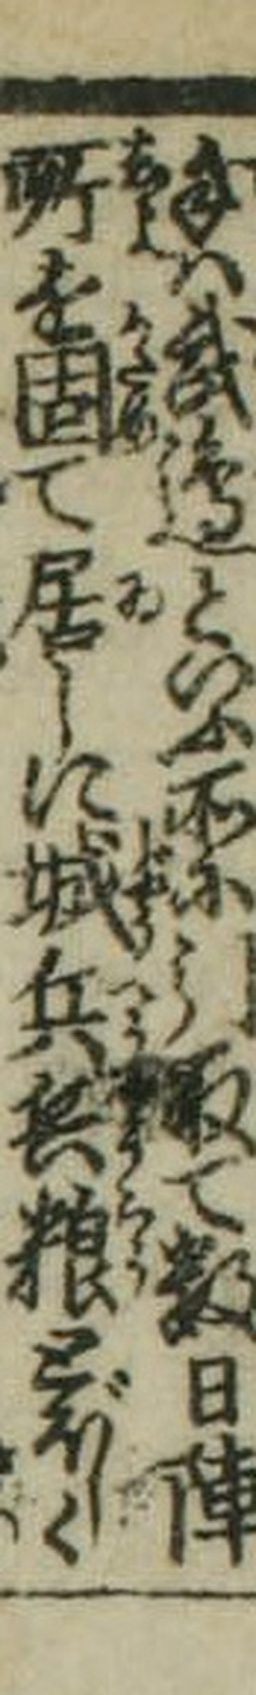所を固て居しに城兵兵粮とぼしく
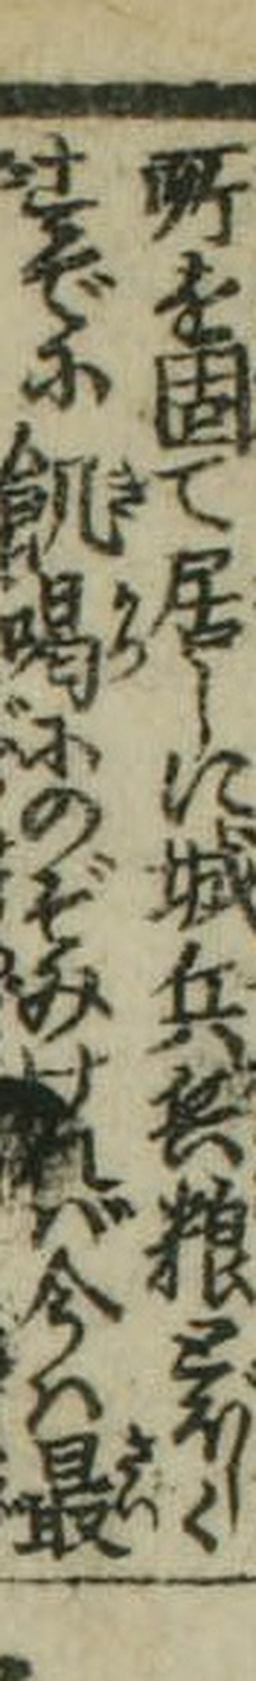すでに飢喝にのぞみければ今は最
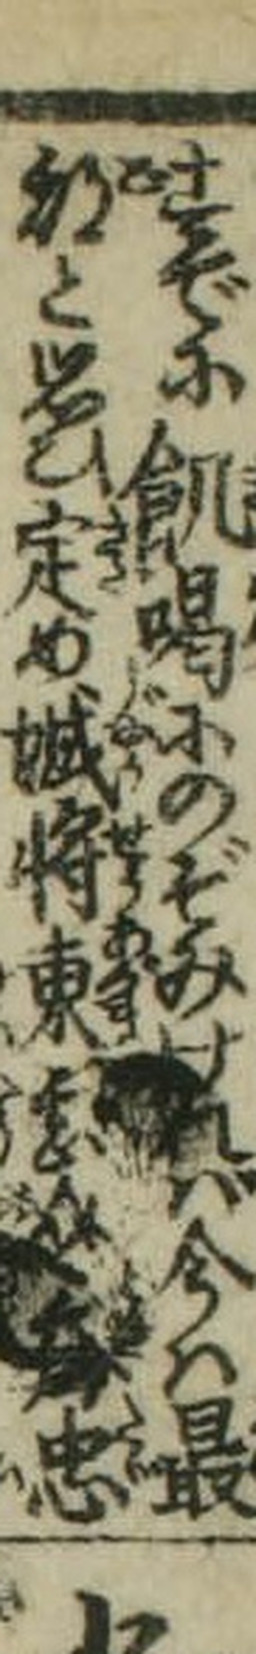期と思ひ定め城将東甚介忠
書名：續英雄百人一首
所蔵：東京学芸大学附属図書館
